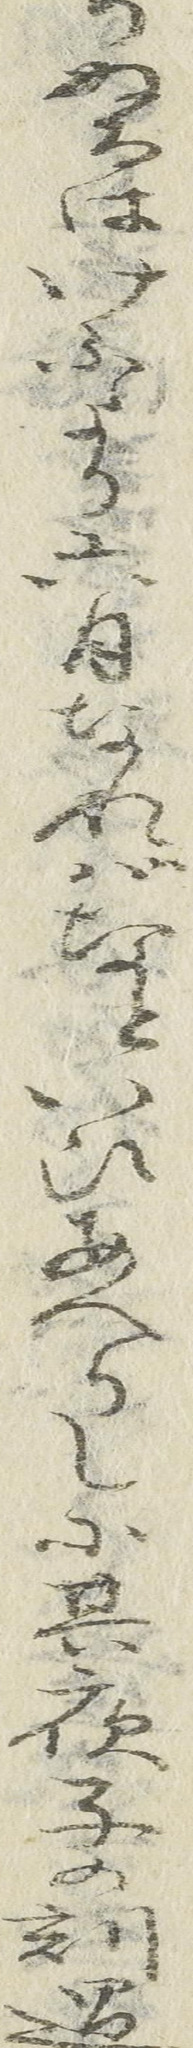りぬるはけふより六月なれバなといひあへりしに其夜子の刻過
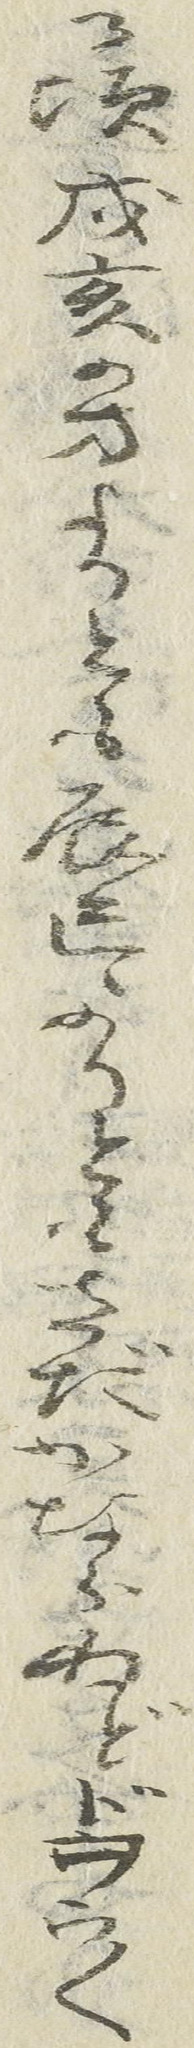る頃戌亥の方よりとも辰巳よりともさだかならねどドヲウ〳〵

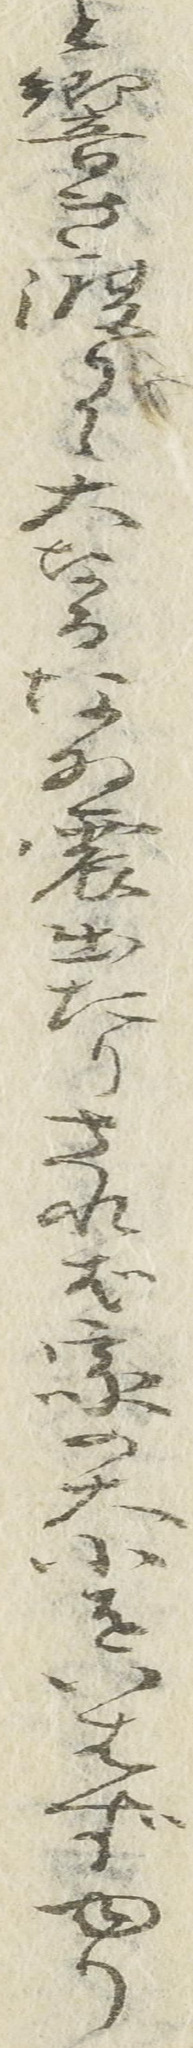と響き渡りて大なるなゐ震出たりされば家の大小をいはずゆり
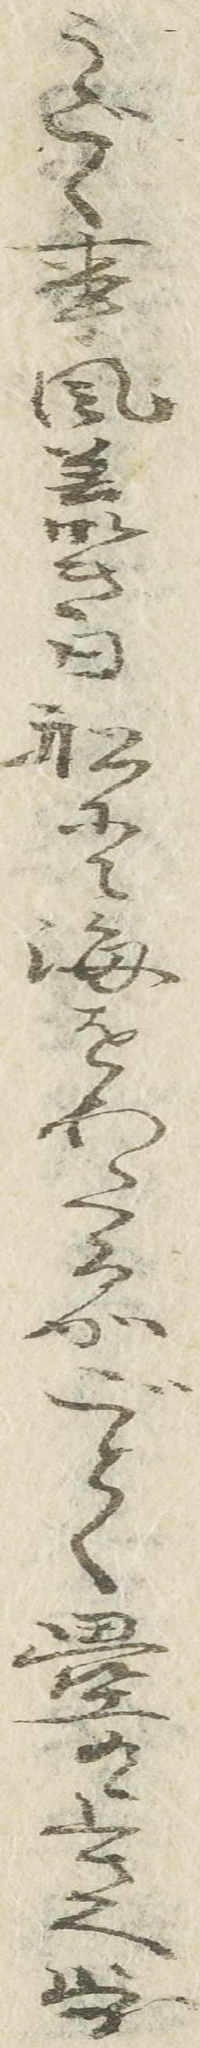うごく事風恙なき日船にて海をわたるかごとく塁の上さへ歩
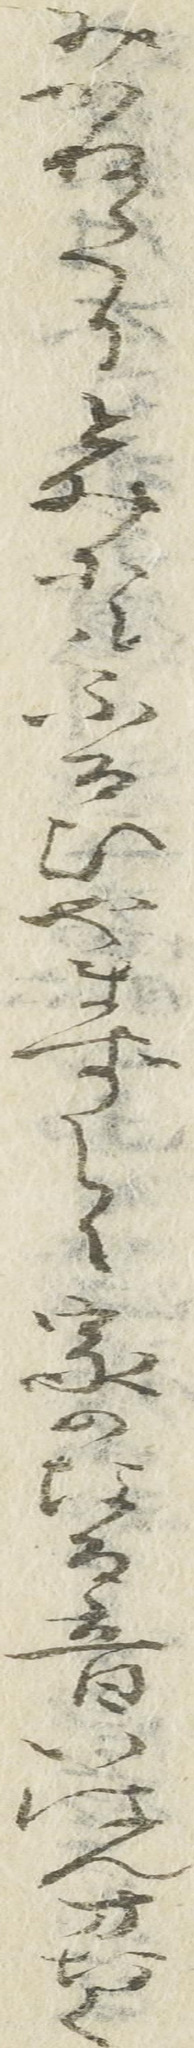みかねたりとみにもふるひやまずして家のなる音いはん方なく
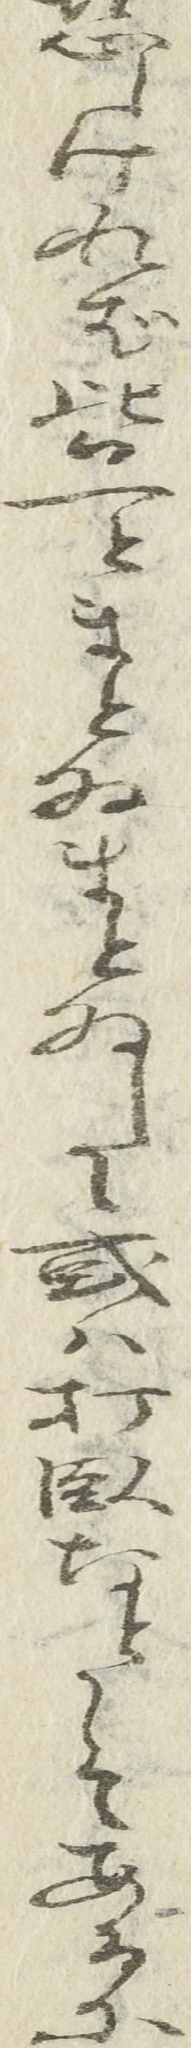恐しければ皆一とまとゐまとゐして或ハ打臥なとしてあるに
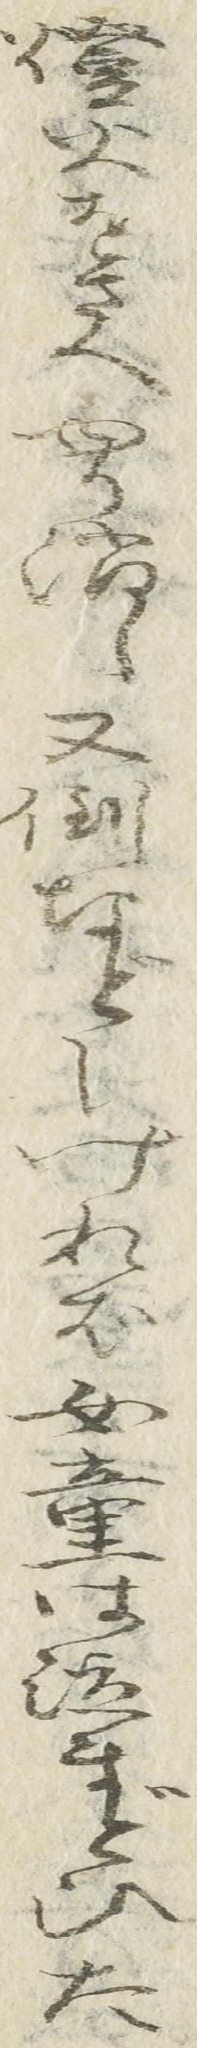燈火をさへゆり消し又倒などしければ女童は泣まどひた
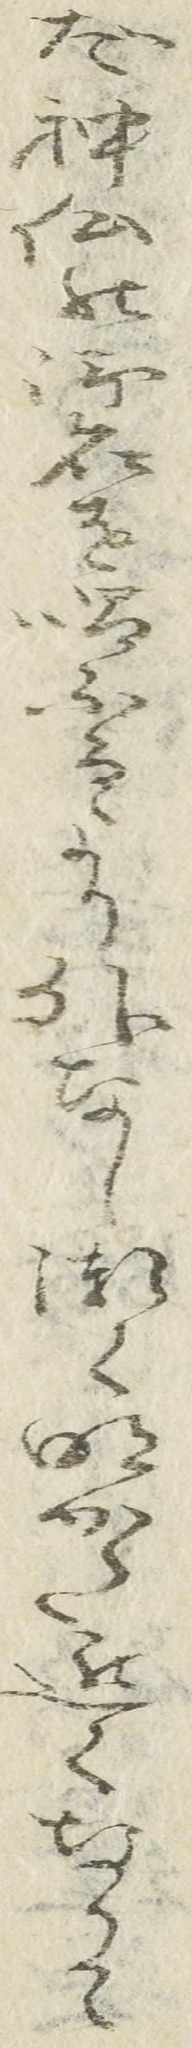だ神仏の御名を唱ふるより外なし漸く明かた近くなりて
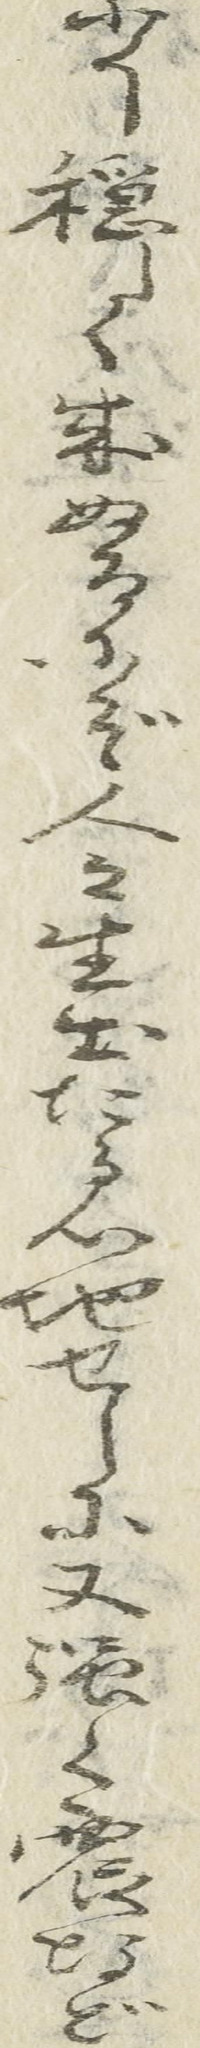少し穏しく成ぬるにぞ人々生出る心地セしに又強く震など
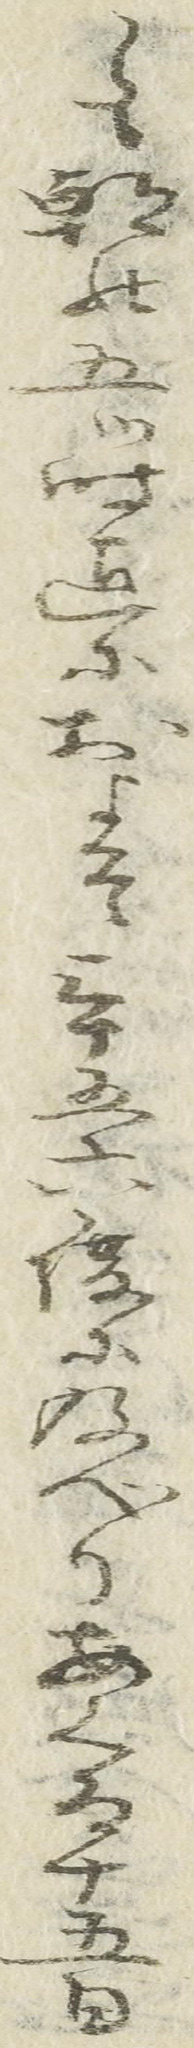しも朝の五ツ時迄におよそ三十五六度に及べりあくる十五日
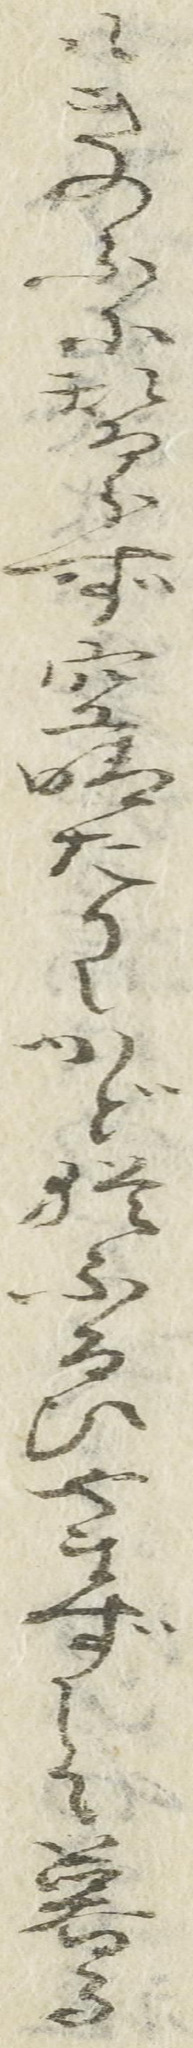もきのふに替らず空晴たりしかど猶ふるひやまずして暮る
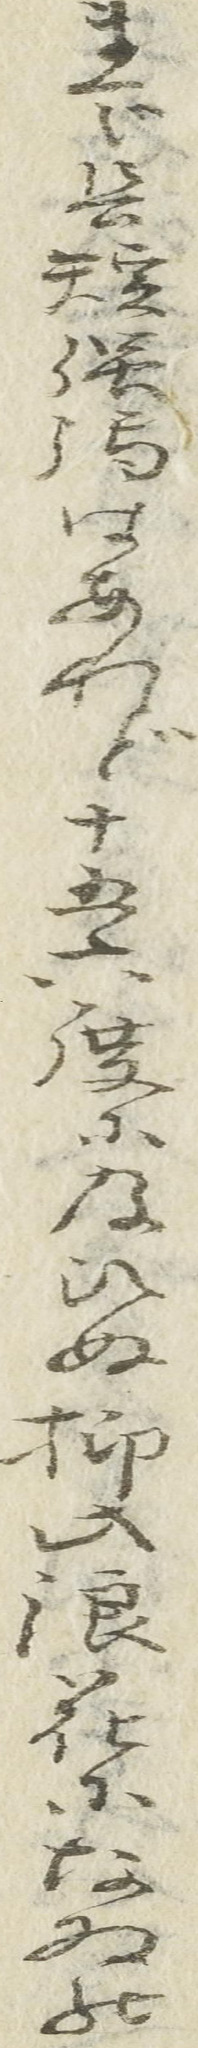まで長短強弱はあれど十五六度に及ひぬ抑此浪花になゐの
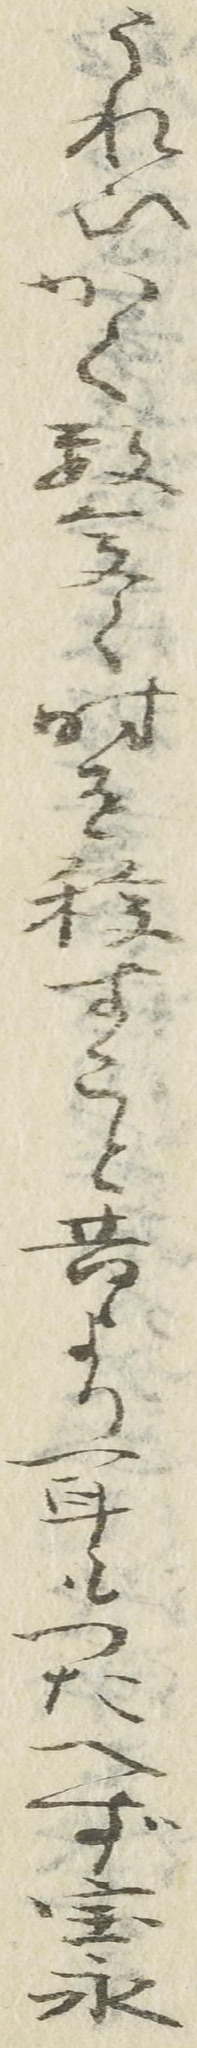うれひかく数多く時を移すこと昔より聞もつたへず宝永
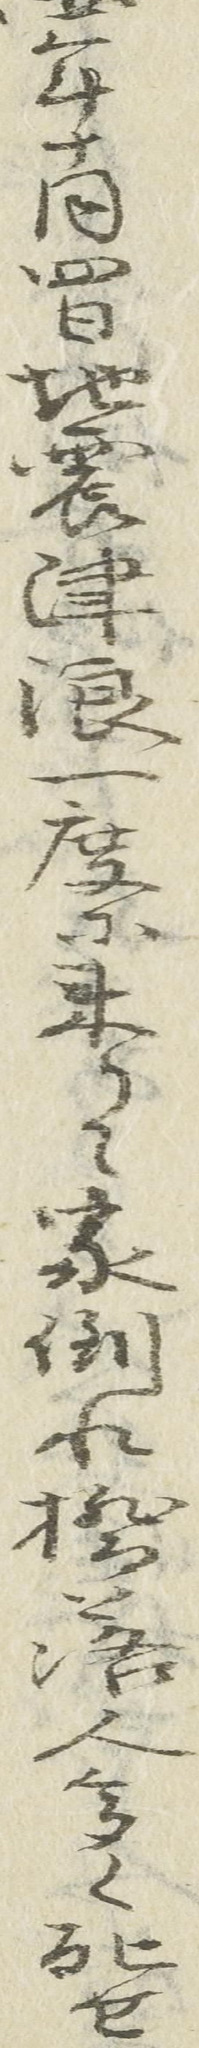四年十月四日地震津浪一度に来りて家倒れ橋落人多く死セ
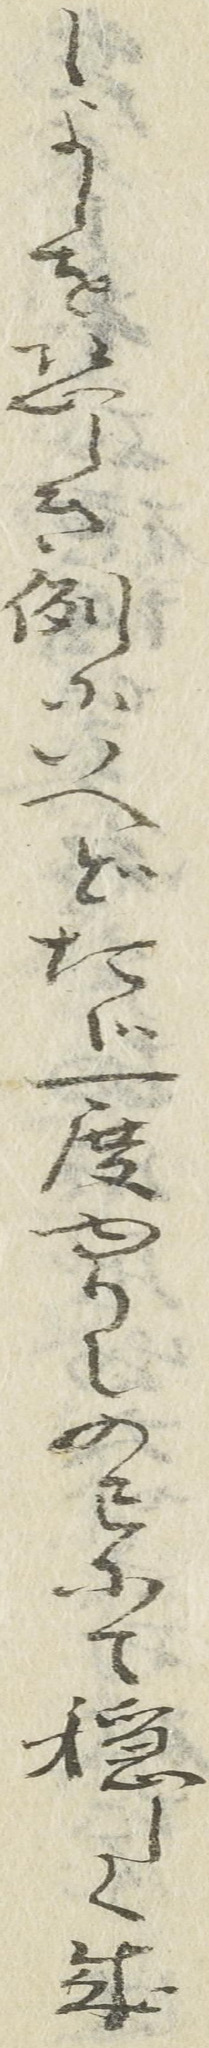しよしを恐しき例にいへどたゞ一度ゆりしのみにて穏しく成
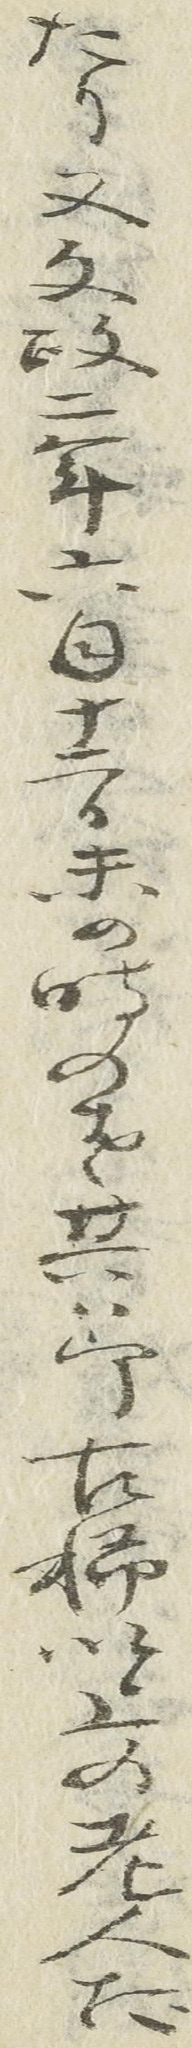たり又文政二年六月十二日未の時のを其節古稀以上の老人だ
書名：地震前兆集　全
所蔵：東京大学地震研究所図書室 Earthquake Research Institute Library, The University of Tokyo, JAPAN
